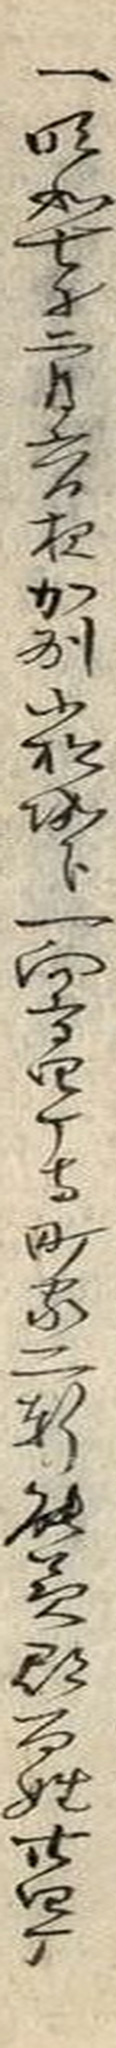一明和七寅二月六日夜加州小松城下一向寺四ケ寺町家二軒能美郡百姓廿四ケ
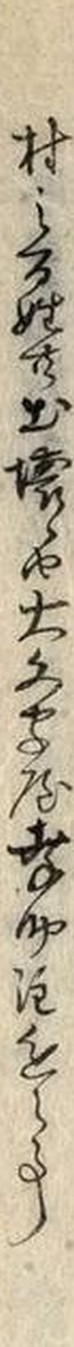村之百姓共出壊候由大文字屋幸助注進之事
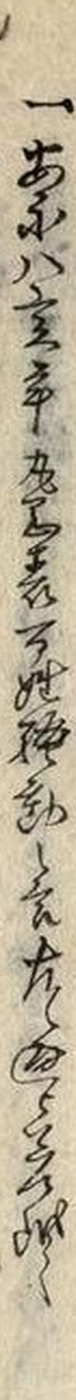一安永八亥年丸岡表百姓騒動之節左之通差越之
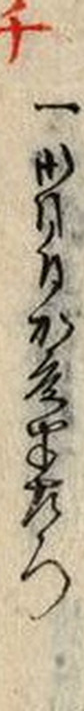一御目付加藤半左衛門

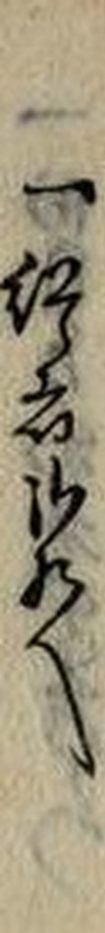一組之者弐拾人
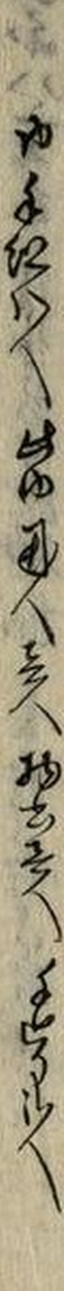内手組八人此内用人壱人物書壱人手廻り弐人
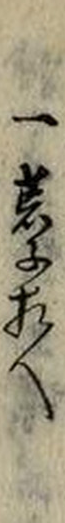一荒子拾人
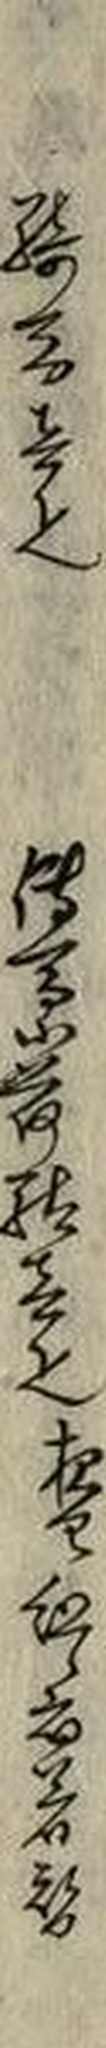騎馬壱疋伝馬小荷駄壱疋夜具組之者着替
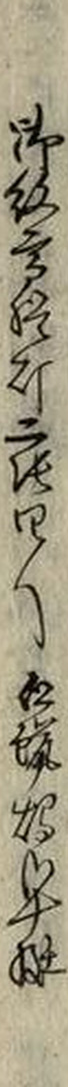御役高提灯二張四人但蝋燭弐十挺
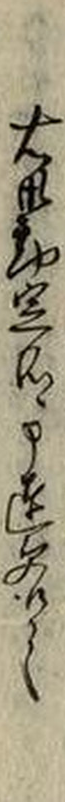右御勘定所へ申達受取之
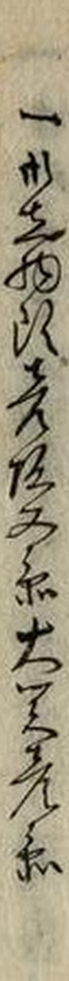一御先物頭彦坂又兵衛大関彦兵衛
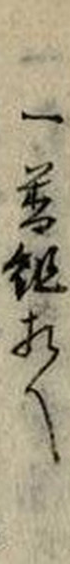一番組拾人
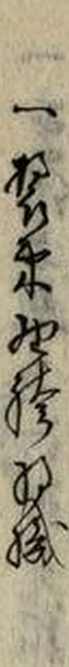一装束野袴羽織
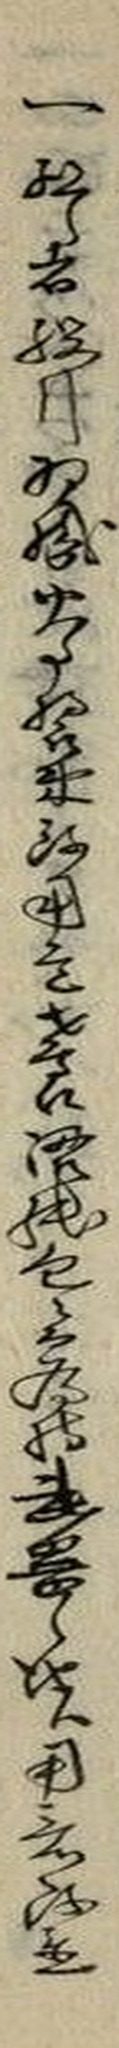一組之者股引羽織火事装束致用意鳶口渋紙包ニ而為持武器之儀ハ用意致置
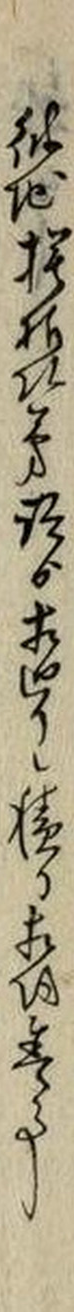彼地模様次第跡ゟ相廻り候積り相伺置候事
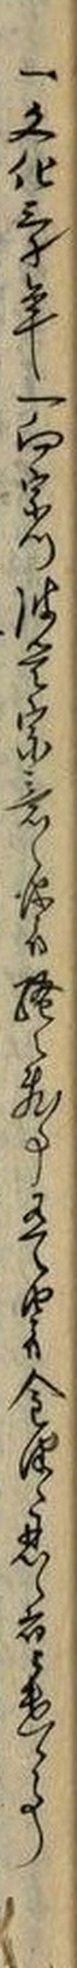一文化三寅年一向宗門彼是宗意之儀ニ付騒々敷事有之由ニ付金津へ忍之者被遣候事
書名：御国他国諸事之部
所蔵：福井県文書館 Fukui Prefectural Archives
